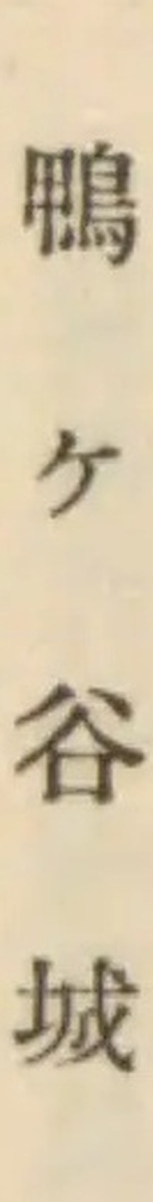鴨ケ谷城
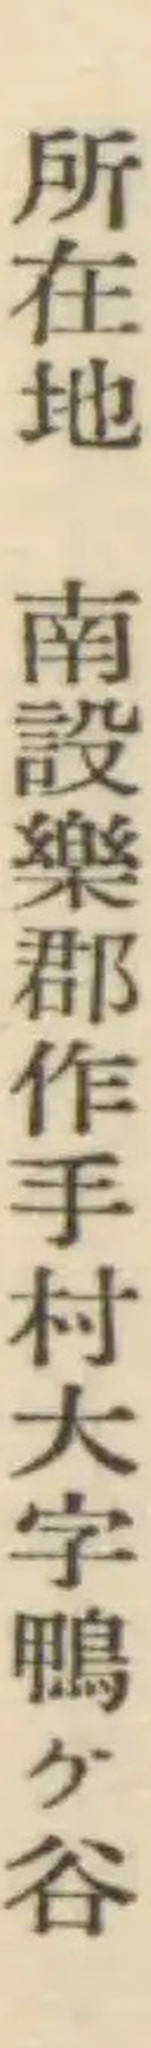所在地南設楽郡作手村大字鴨ケ谷
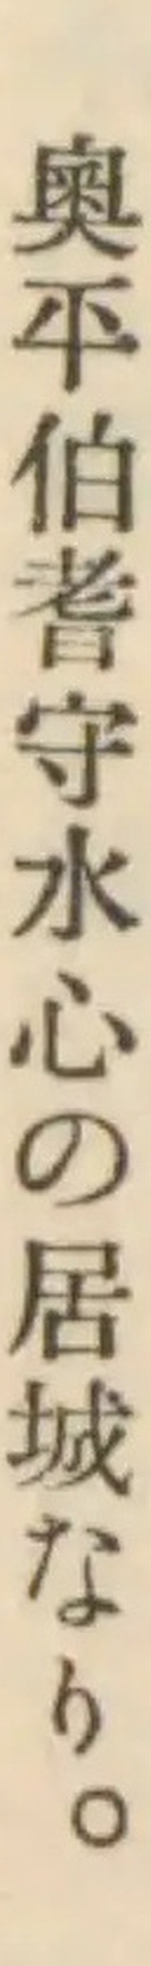奥平伯耆守水心の居城なり。
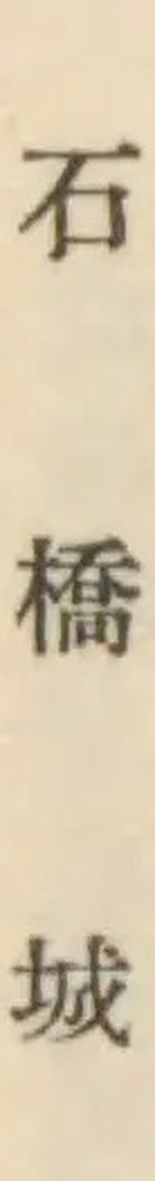石橋城
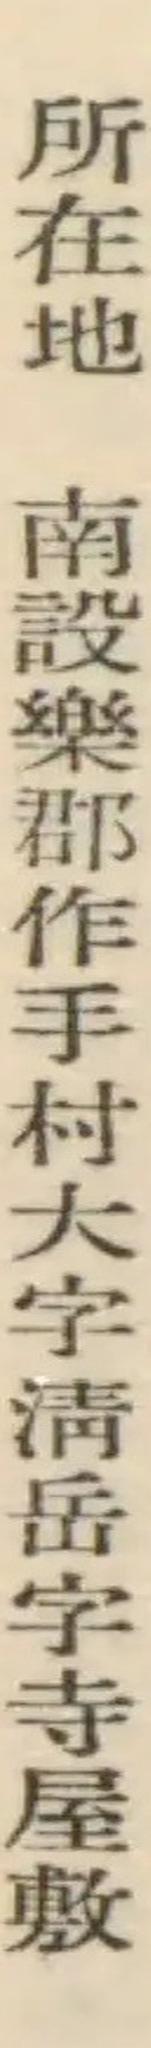所在地南設楽郡作手村大字清岳字寺屋敷
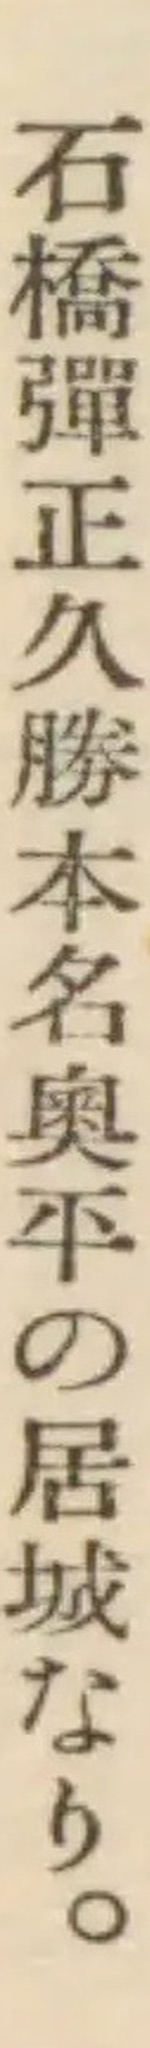石橋弾正久勝本名奥平の居城なり。
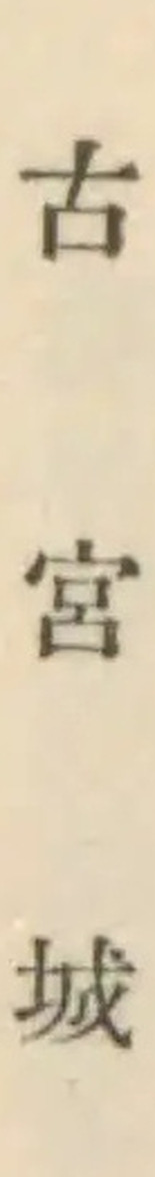古宮城
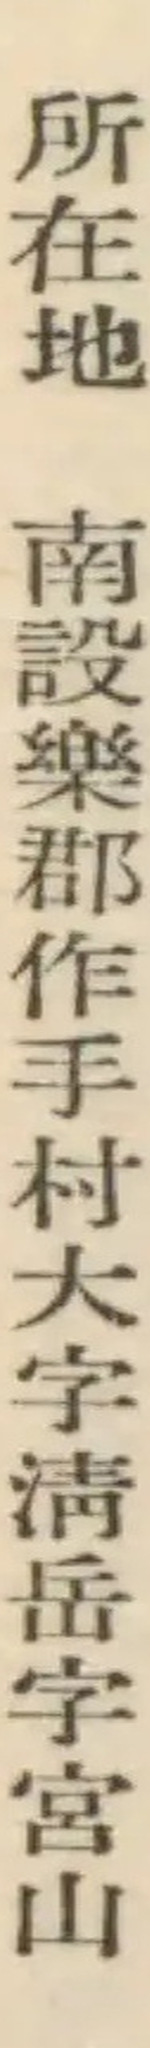所在地南設楽郡作手村大字清岳字宮山
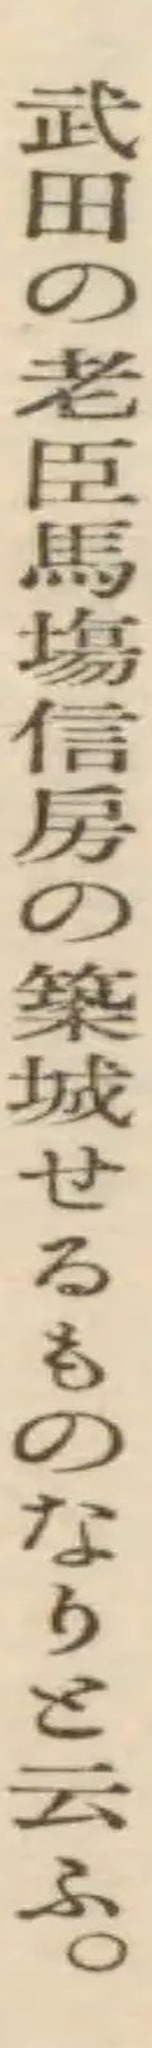武田の老臣馬場信房の築城せるものなりと云ふ。
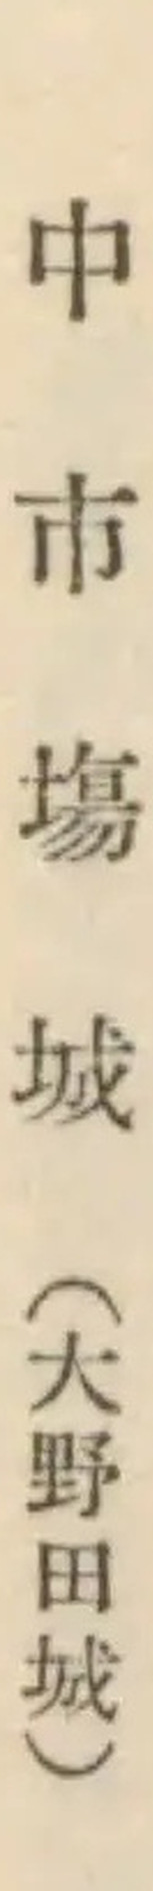中市場城(大野田城)
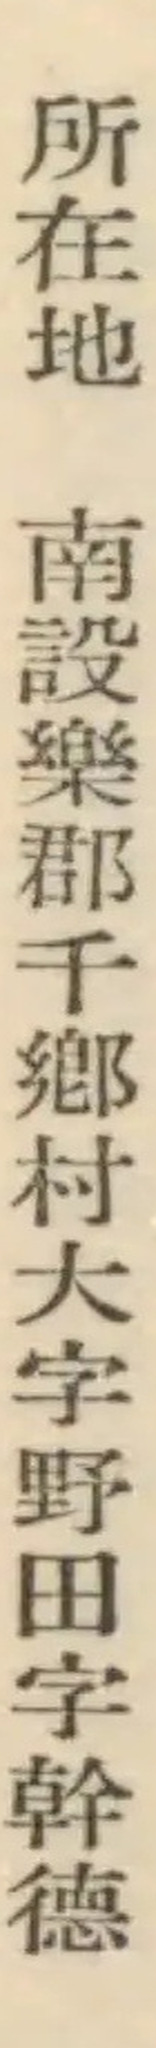所在地南設楽郡千郷村大字野田字幹徳
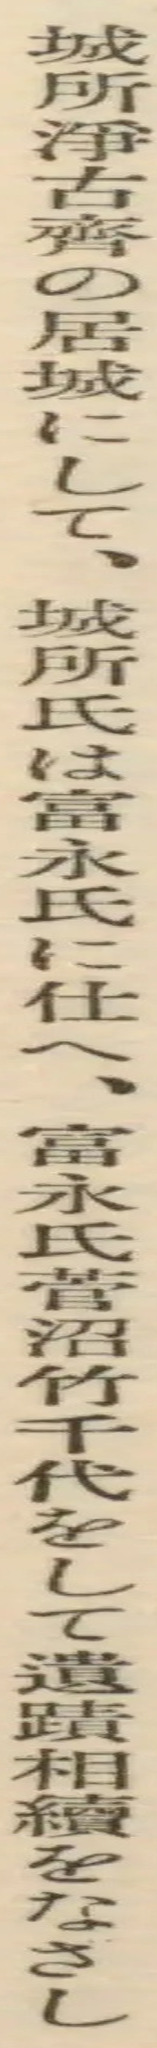城所浄古斉の居城にして、城所氏は富永氏に仕へ、富永氏菅沼竹千代をして遺蹟相続をなさし
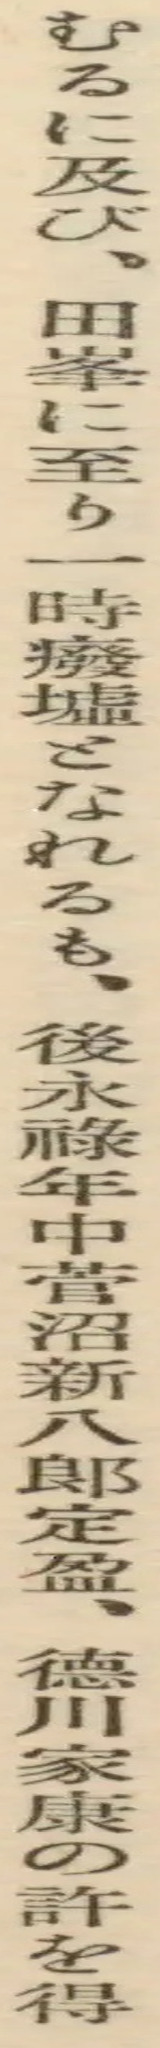むるに及び、田峯に至り一時廃墟となれるも、後永禄年中菅沼新八郎定盈、徳川家康の許を得
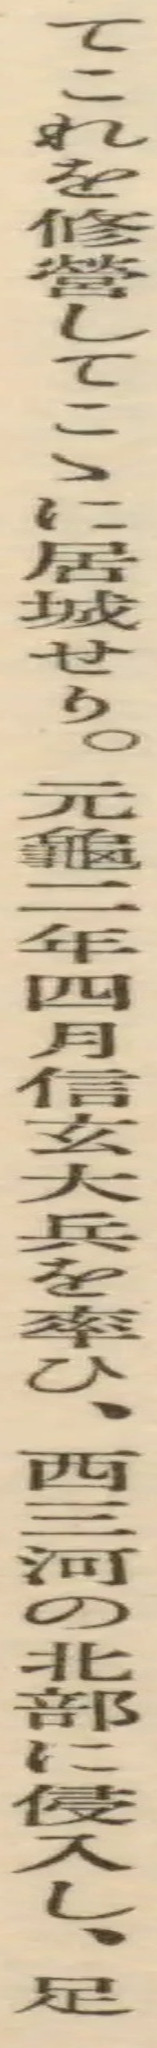てこれを修営してこゝに居城せり。元亀二年四月信玄大兵を率ひ、西三河の北部に侵入し、足
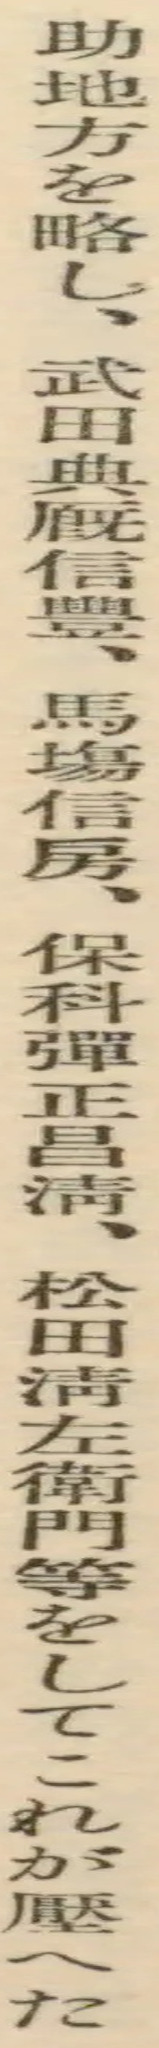助地方を略し、武田典厩信豊、馬場信房、保科弾正昌清、松田清左衛門等をしてこれが壓へた
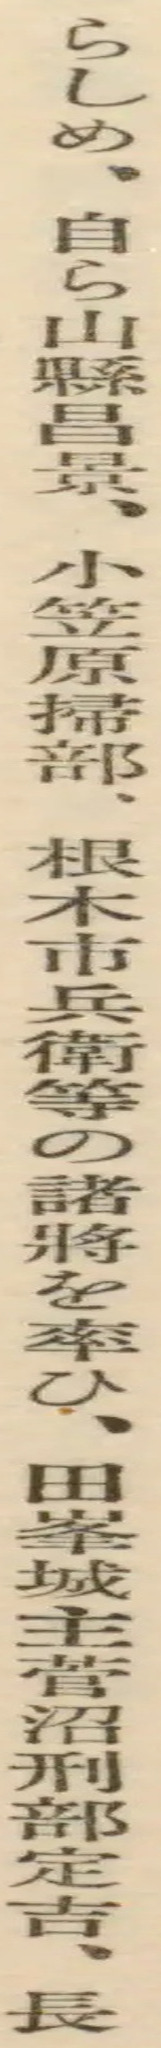らしめ、自ら山縣昌景、小笠原掃部、根木市兵衛等の諸将を率ひ、田峯城主菅沼刑部定吉、長
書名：東三河之古城
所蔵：国立国会図書館 National Diet Library, JAPAN
